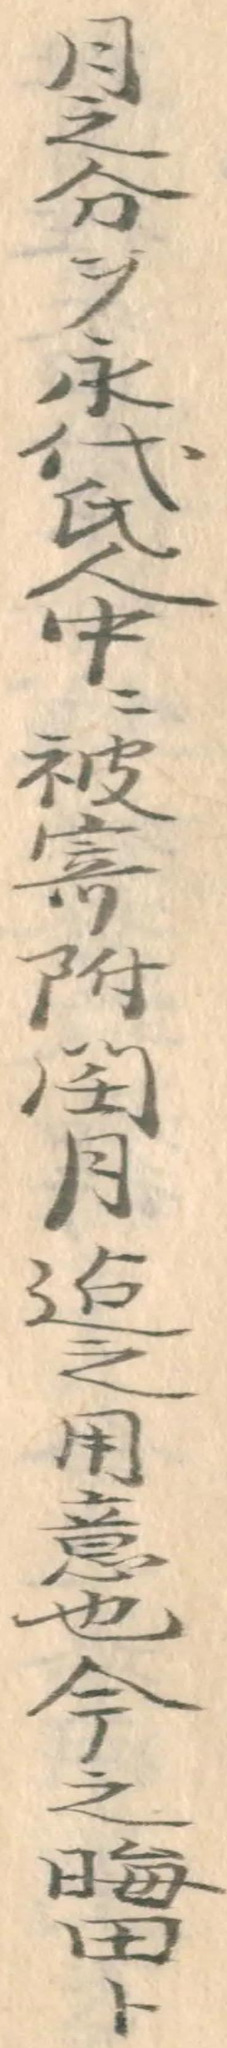月之分ヲ永代氏人中ニ被寄附閏月迄之用意也今之晦田ト
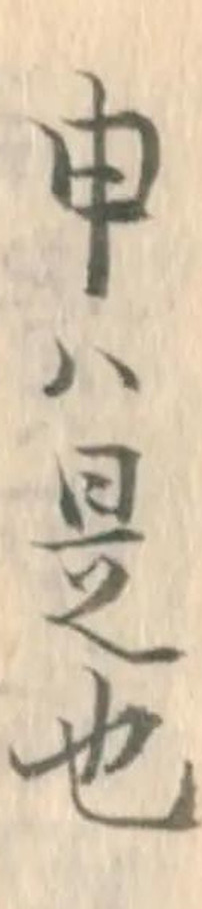申ハ是也
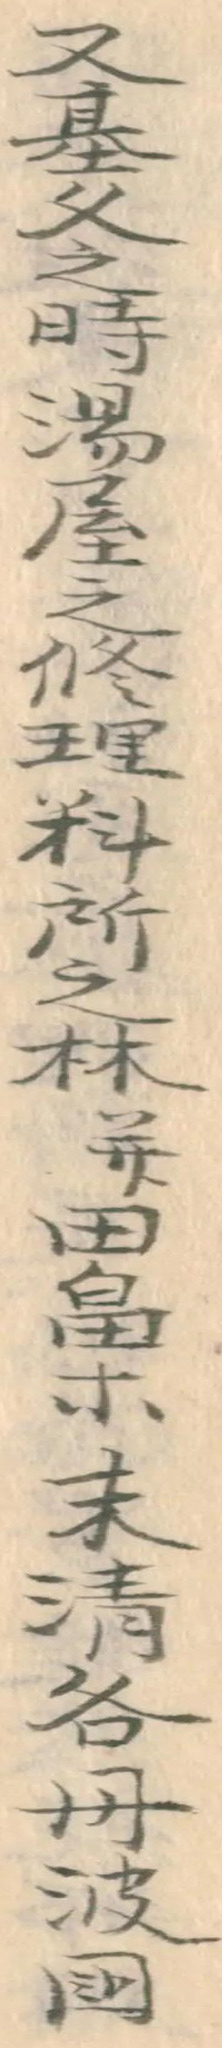又基久之時湯屋之修理料所之林并田畠等未清各丹波国
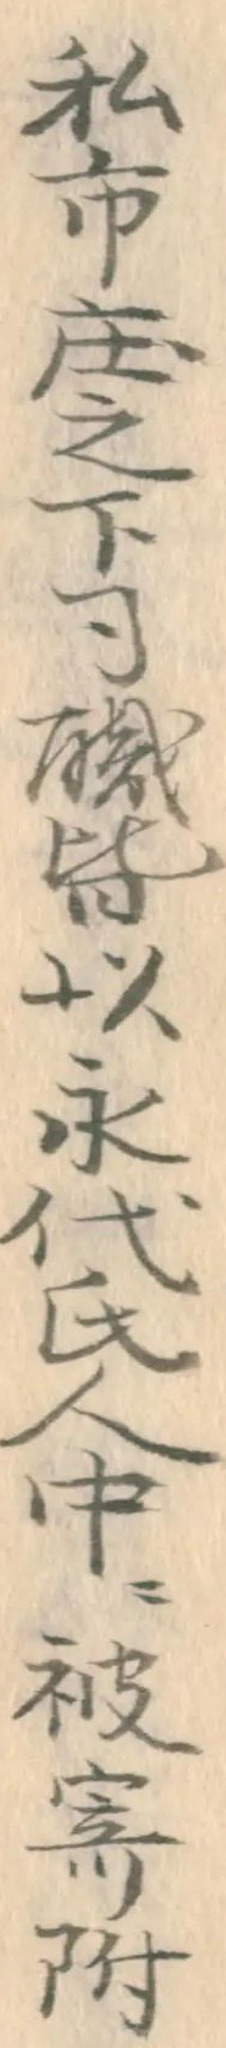私市庄之下司職皆以永代氏人中ニ被寄附
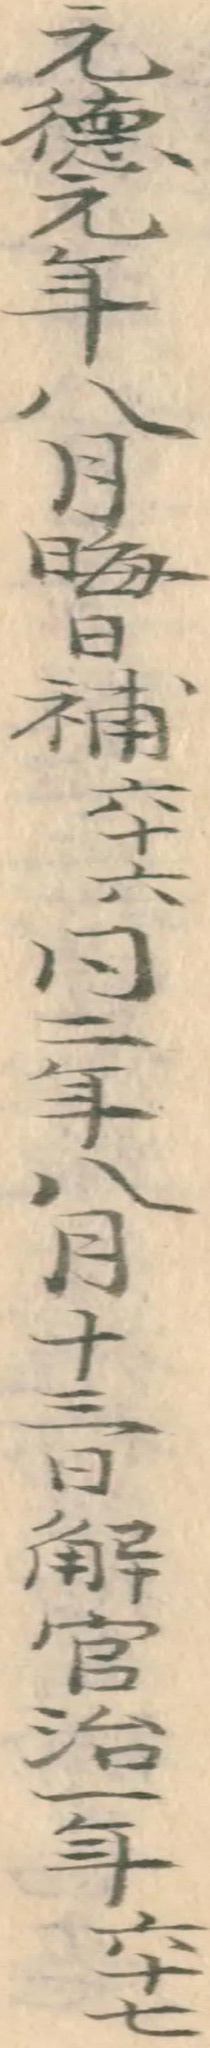元徳元年八月晦日補六十六同二年八月十三日解官治一年六十七
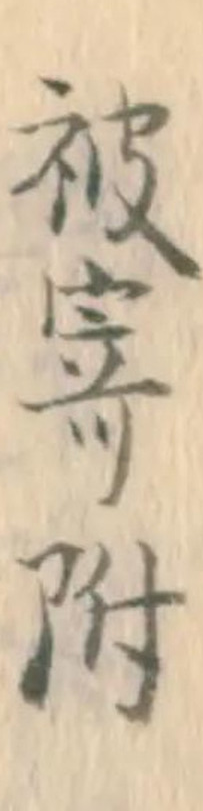被寄附
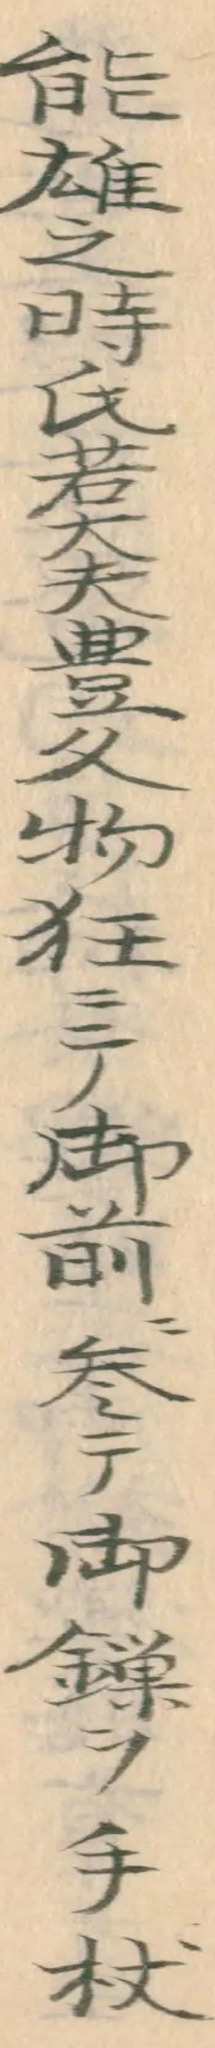能雄之時氏若大夫豊久物狂ニテ御前ニ参テ御鏁ヲ手杖
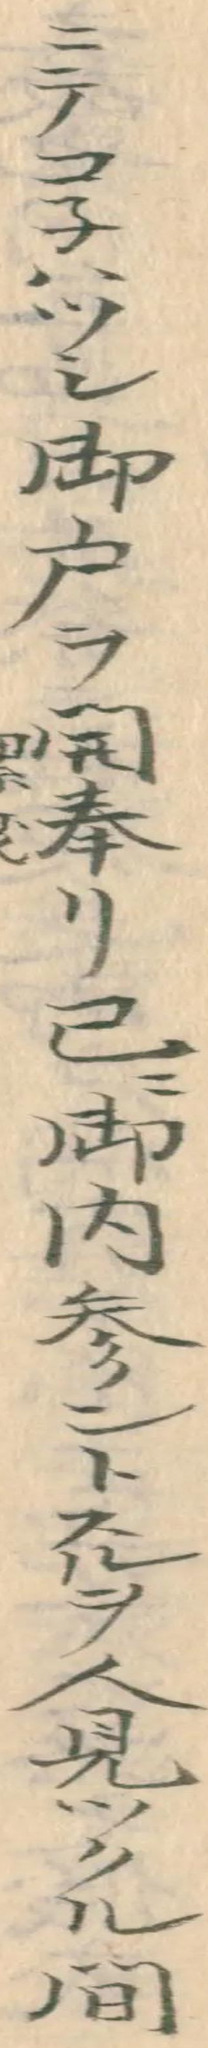ニテコネハツシ御戸ヲ開奉リ已ニ御内参ントスルヲ人見ツクル間
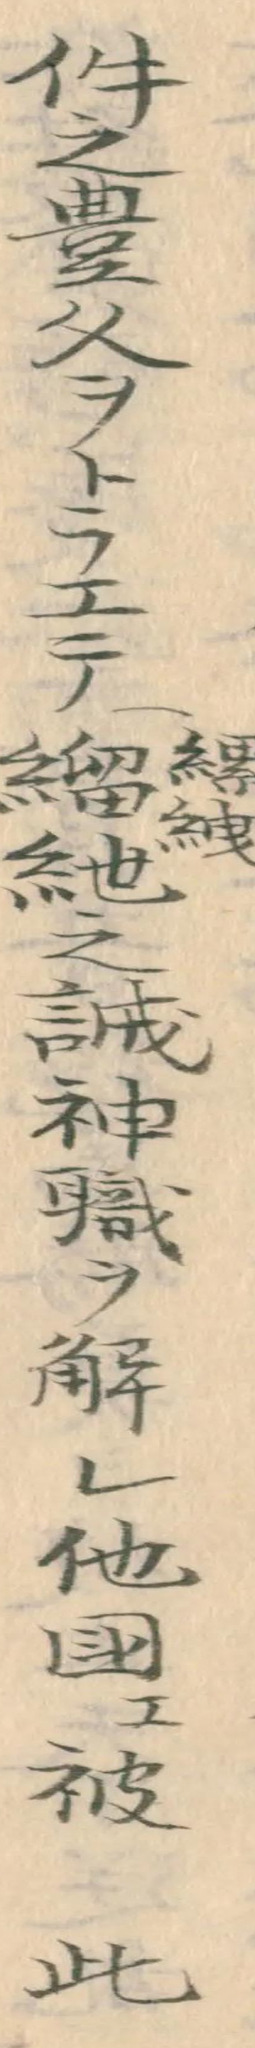件之豊久ヲトラエテ𦃓紲之誠神職ヲ解レ他国エ被此
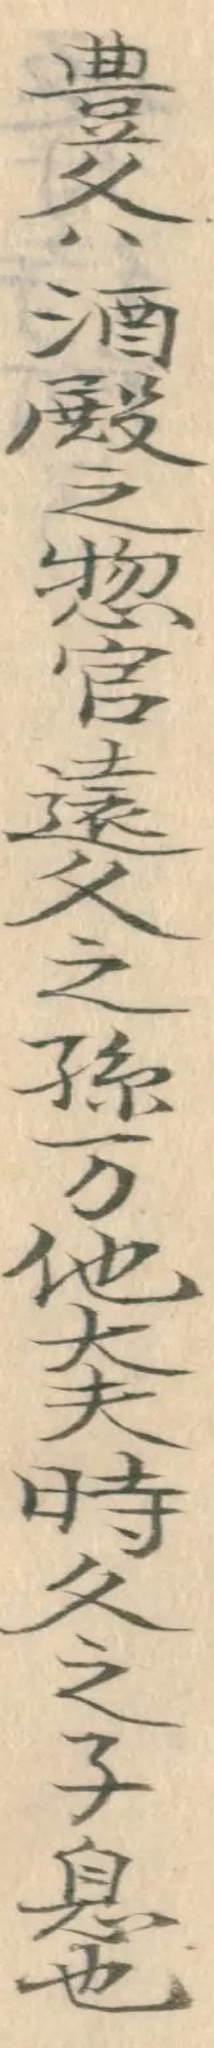豊久ハ酒殿之惣官遠久之孫万他大夫時久之子息也
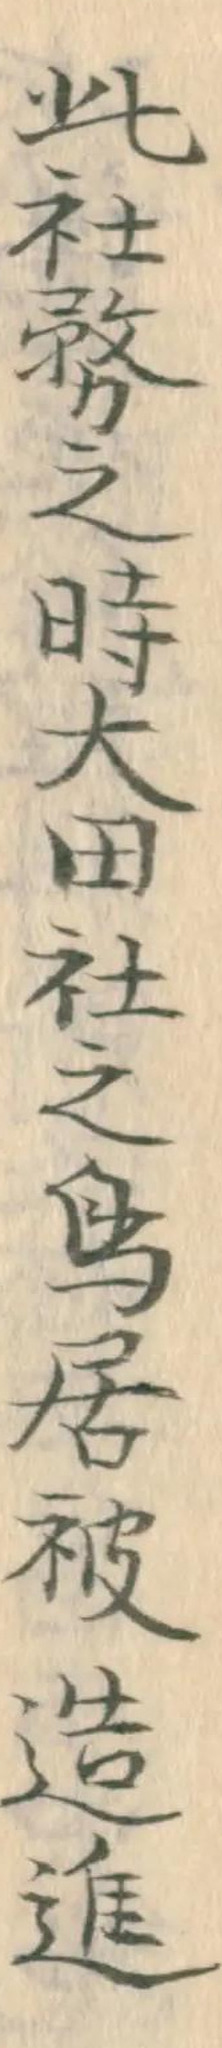此社務之時大田社之鳥居被造進
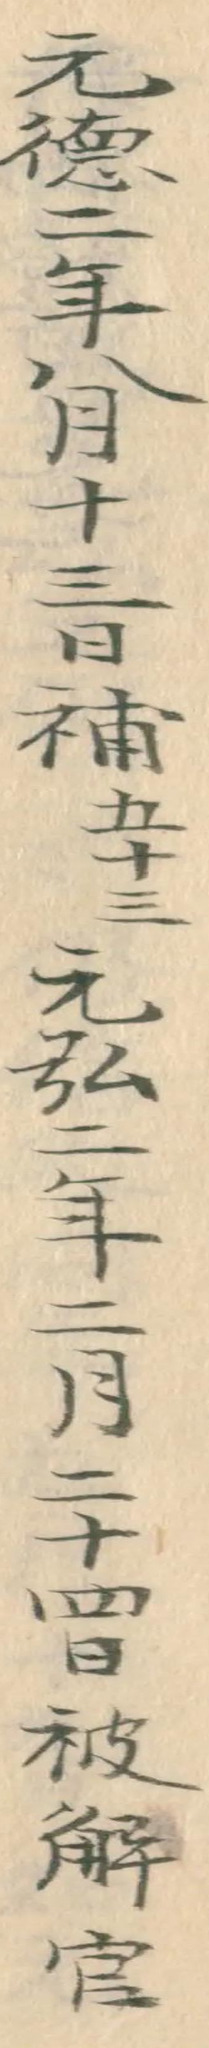元徳二年八月十三日補五十三元弘二年二月二十四日被解官
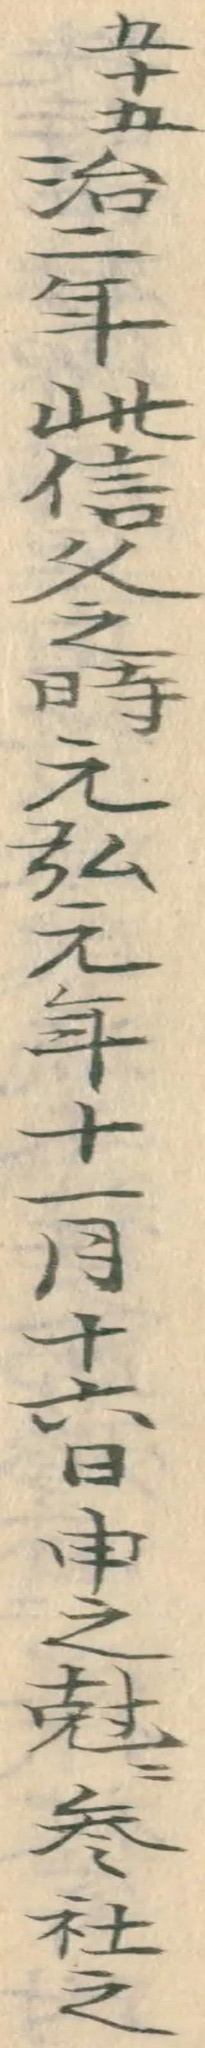五十五治二年此信久之時元弘元年十一月十六日申之剋ニ参社之
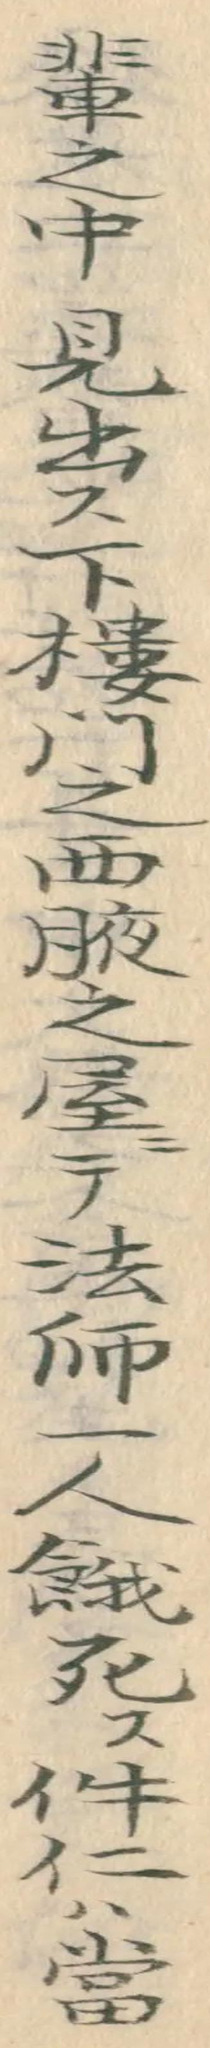輩之中見出ス下楼門之西腋之屋ニテ法師一人餓死ス件仁ハ当
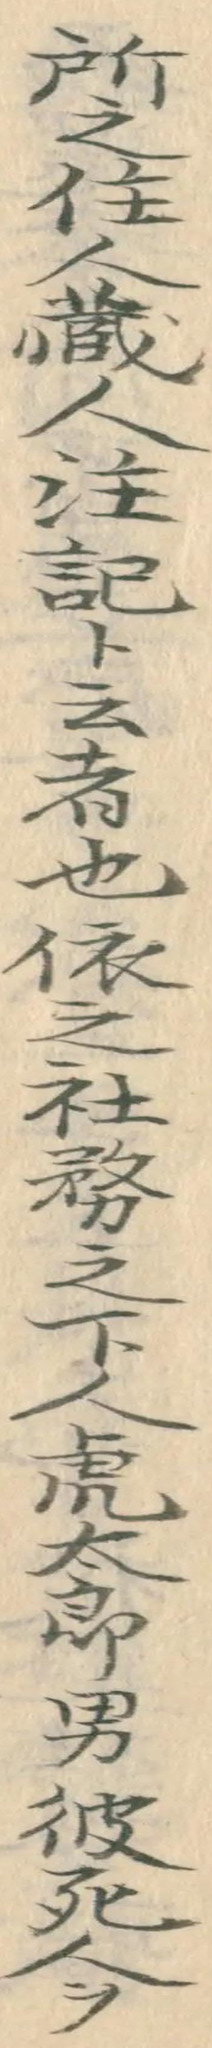所之住人蔵人注記ト云者也依之社務之下人虎太郎男彼死人ヲ
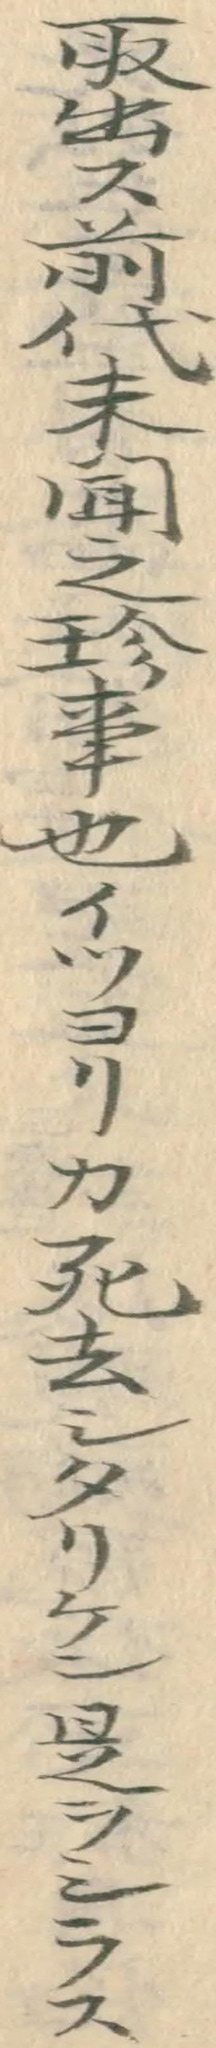取出ス前代未聞之珍事也イツヨリカ死去シタリケン是ヲシラス
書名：賀茂社記録. 第24冊
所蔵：国立国会図書館 National Diet Library, JAPAN
